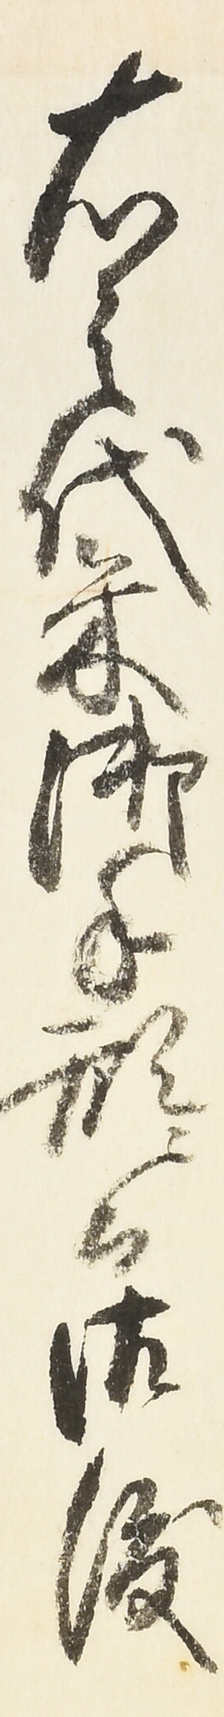右之代米御手形ニ而御渡
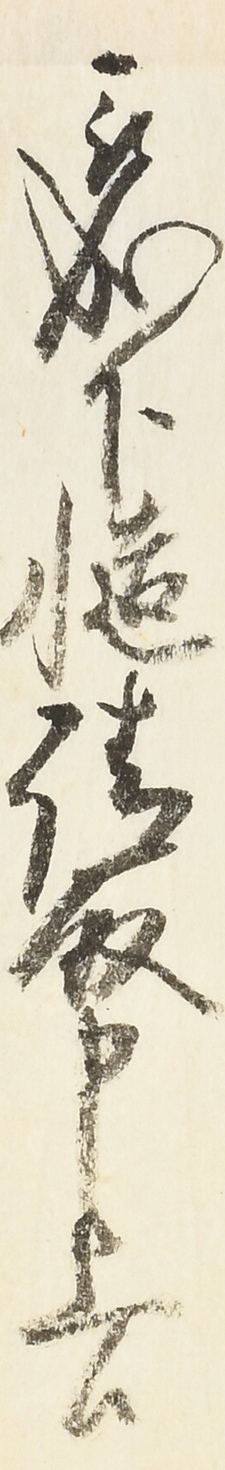被成下慥請取申上候

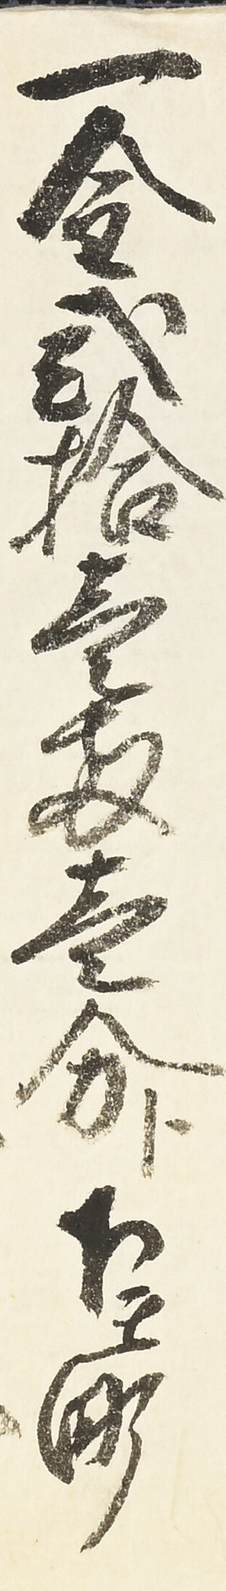一金弐拾壱両壱分ト下モ町
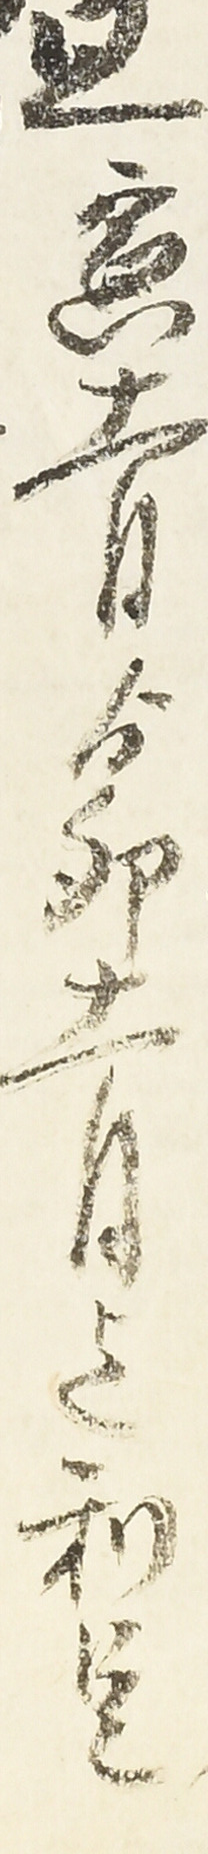但寅十一月ゟ卯十一月迄利足
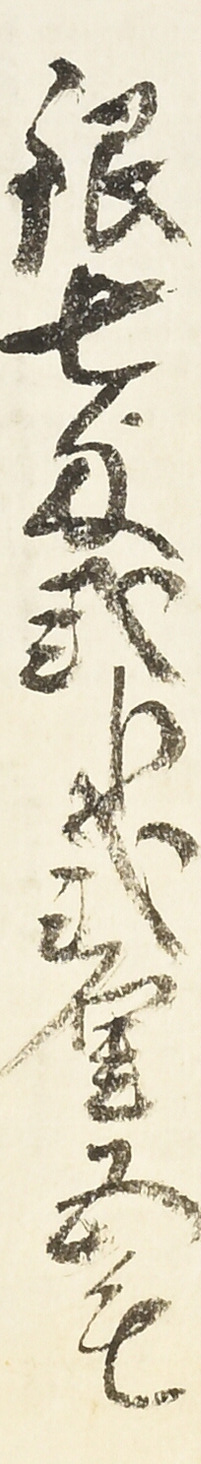銀七匁弐分弐厘五毛
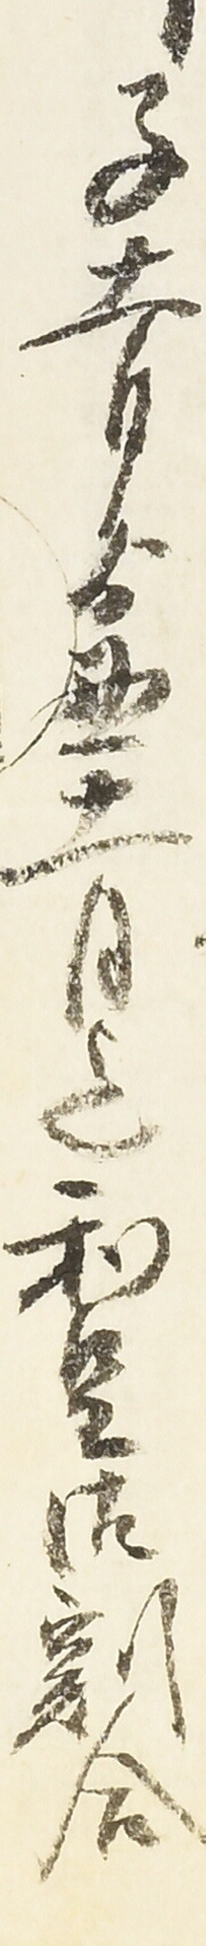子十一月ゟ丑十一月迄利足御割合
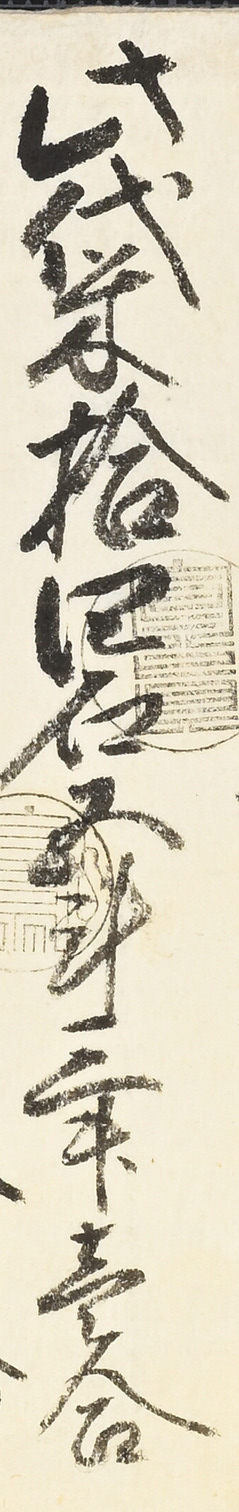此代米拾四石五斗三升壱合
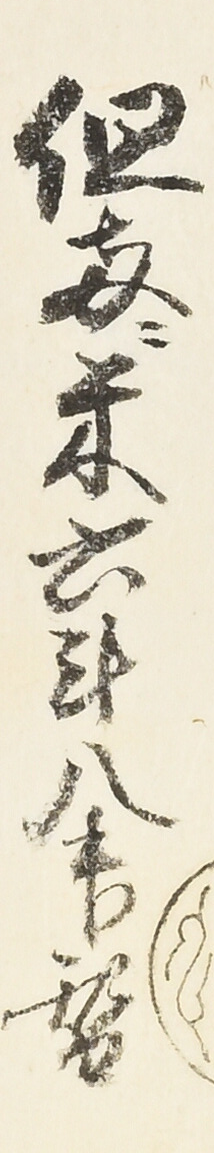但両ニ米六斗八升替
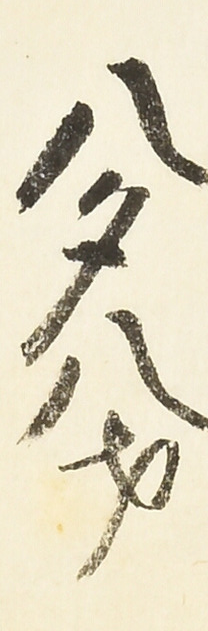八勺八才
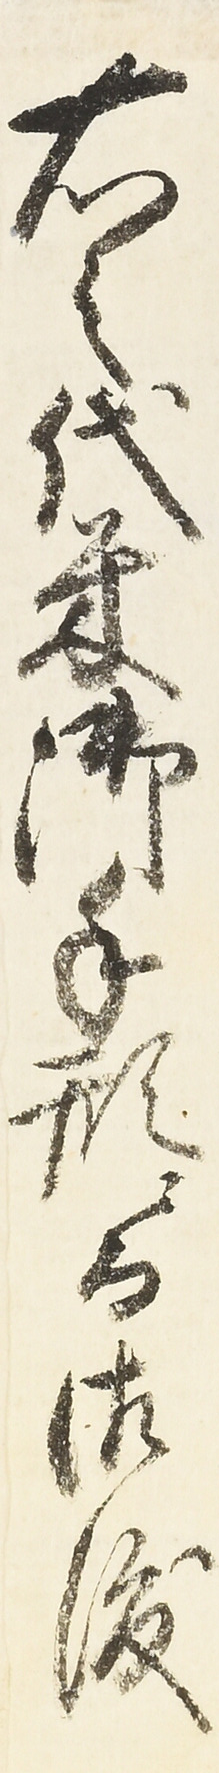右之代米御手形ニ而御渡
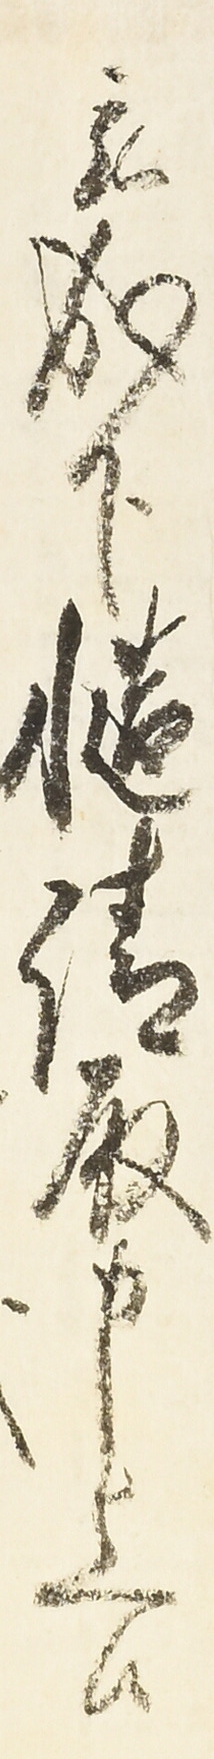立成下慥請取申上候
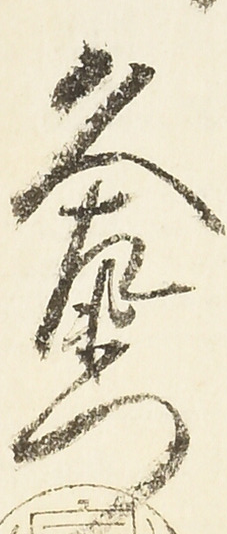久左衛門
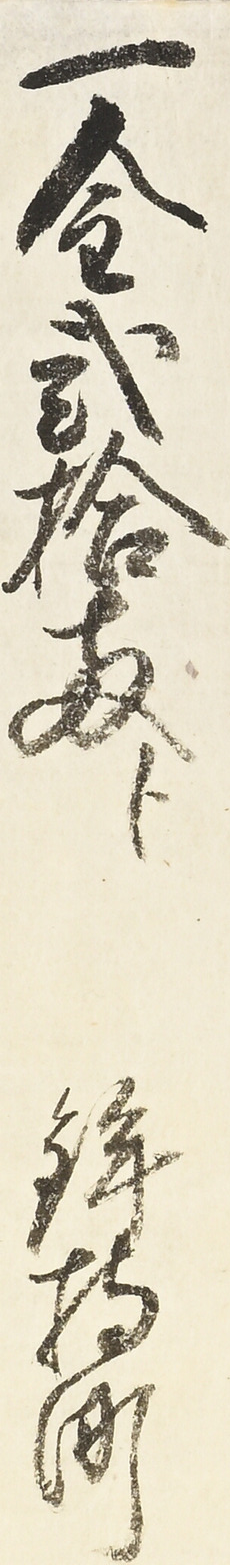一金弐拾両ト鉾持町
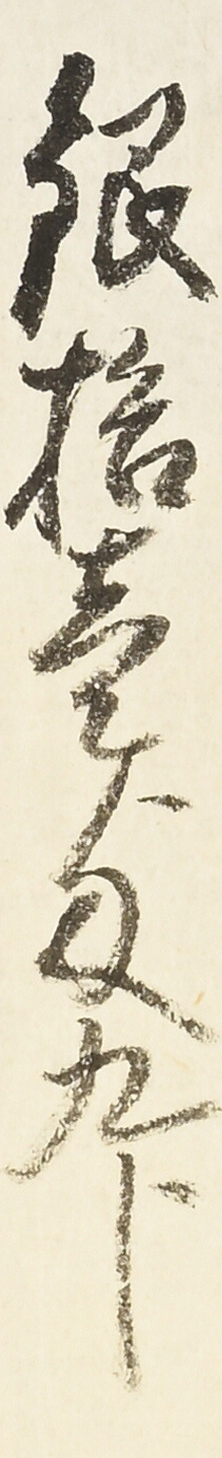銀拾壱匁九分
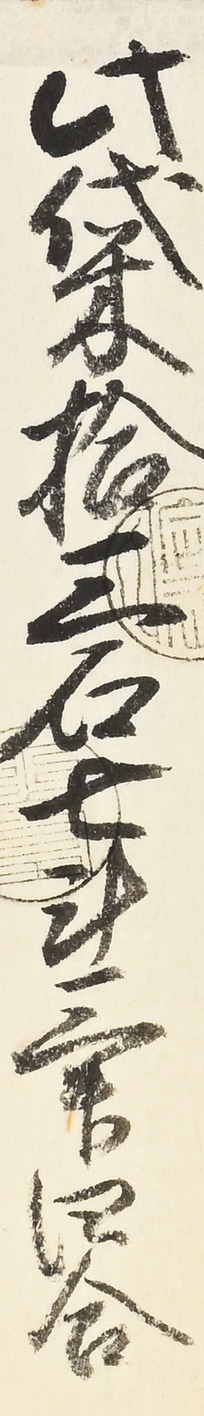此代米拾三石七斗三升四合
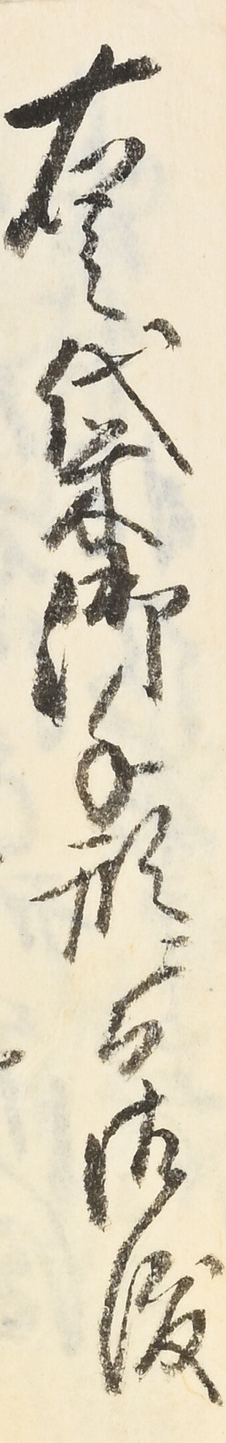右之代米御手形ニ而御渡
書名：御才覚金御利足割渡扣帳
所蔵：伊那市立高遠町図書館・合同会社AMANE
